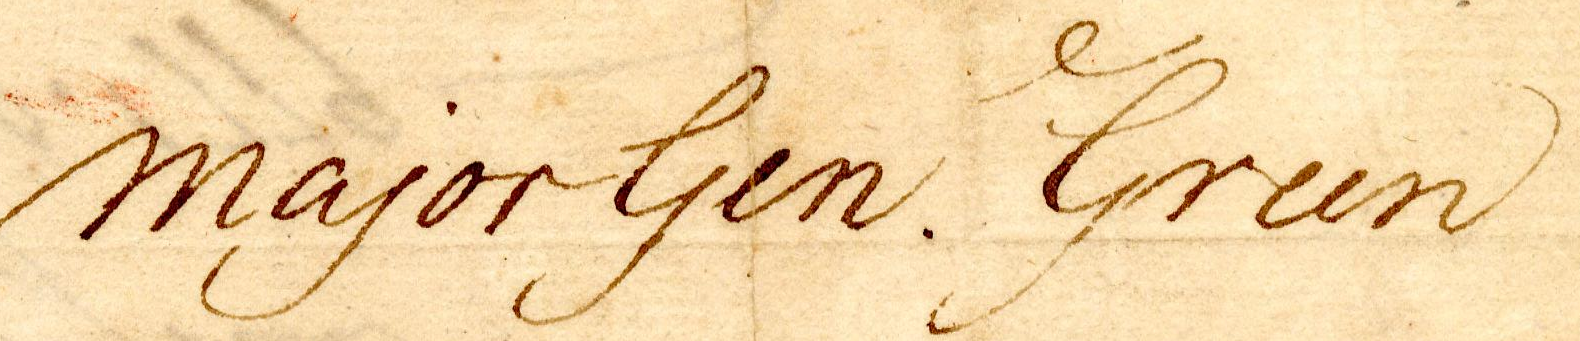Major Gen. Green
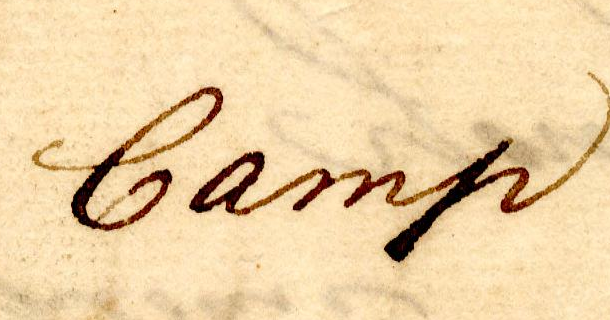Camp
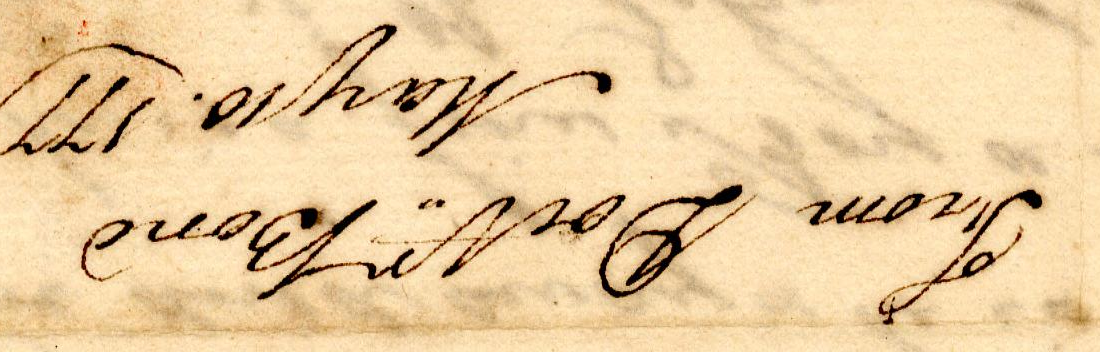From Doct^r. Bond
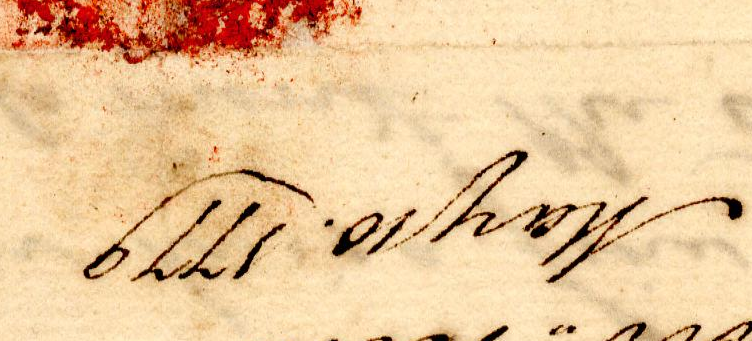May 10. 1779
